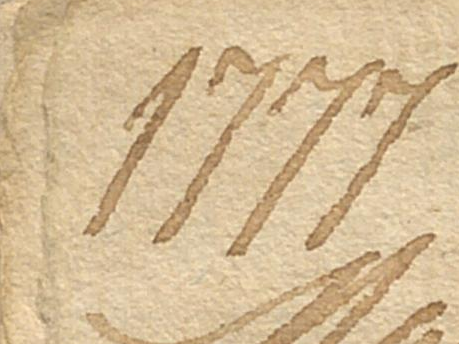1777
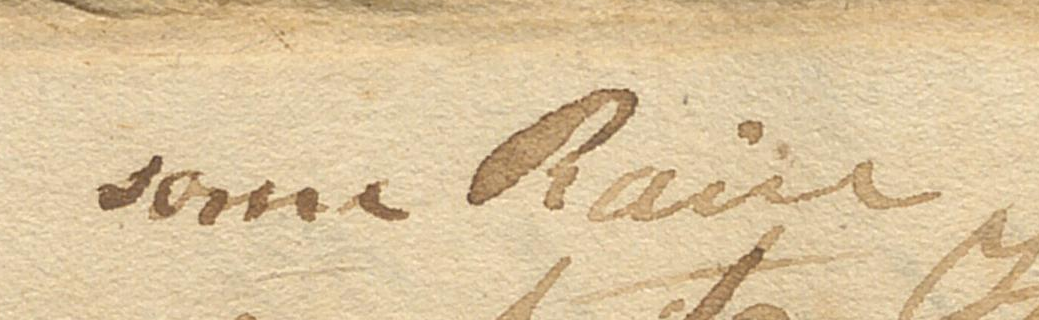some Rain
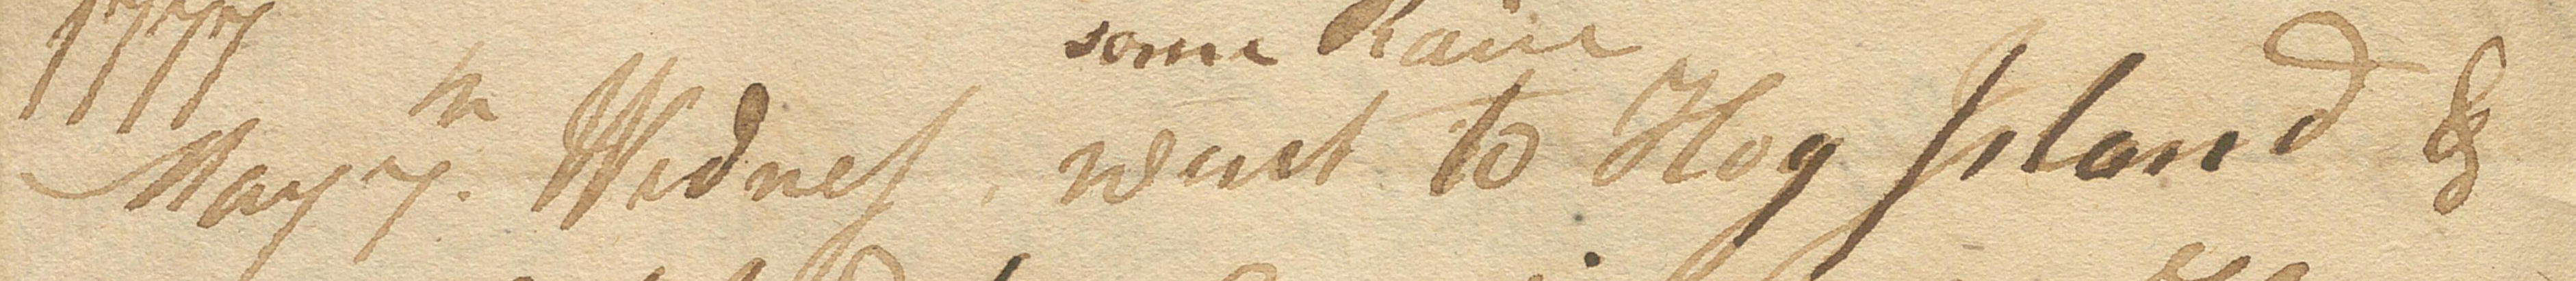May 7^th. Wednes, went to Hog Island &
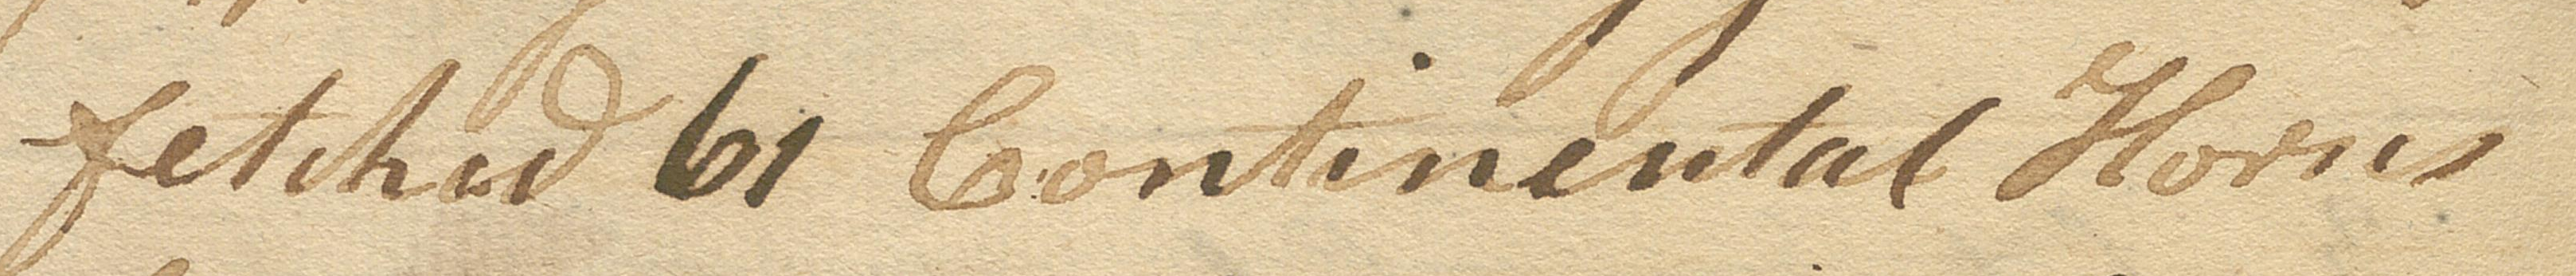fetched 61 Continental Horses
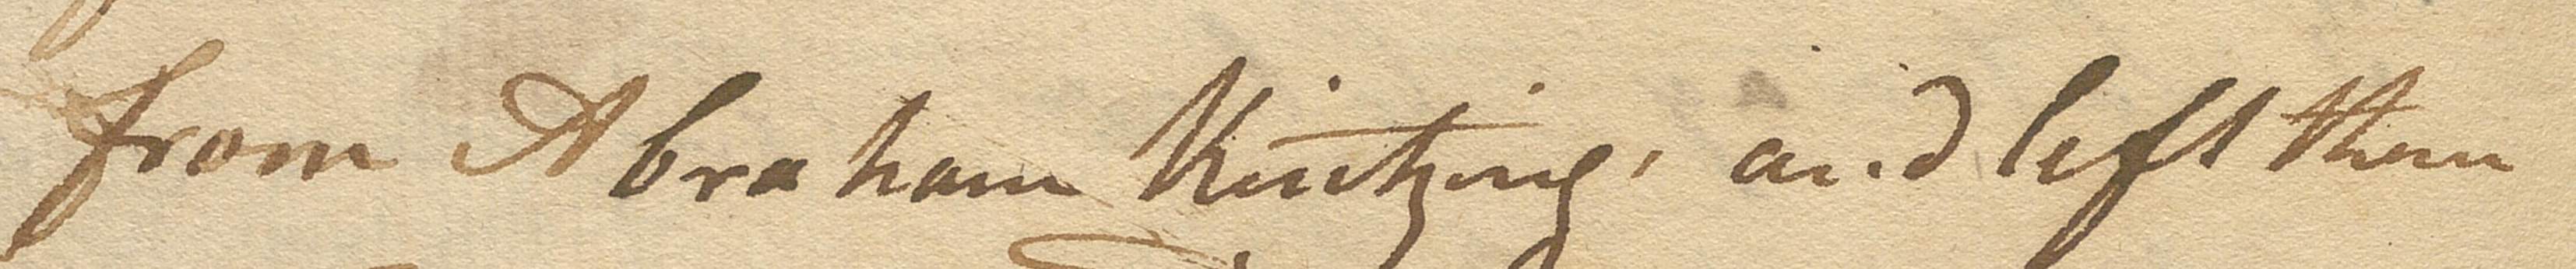from Abraham Kintzing, and left them
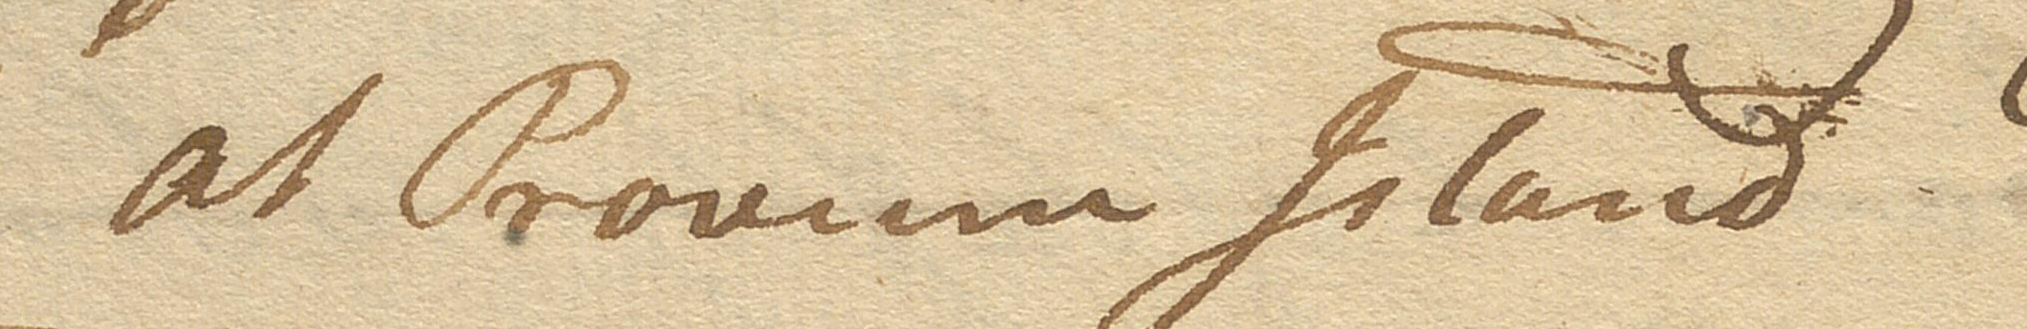at Provence Island
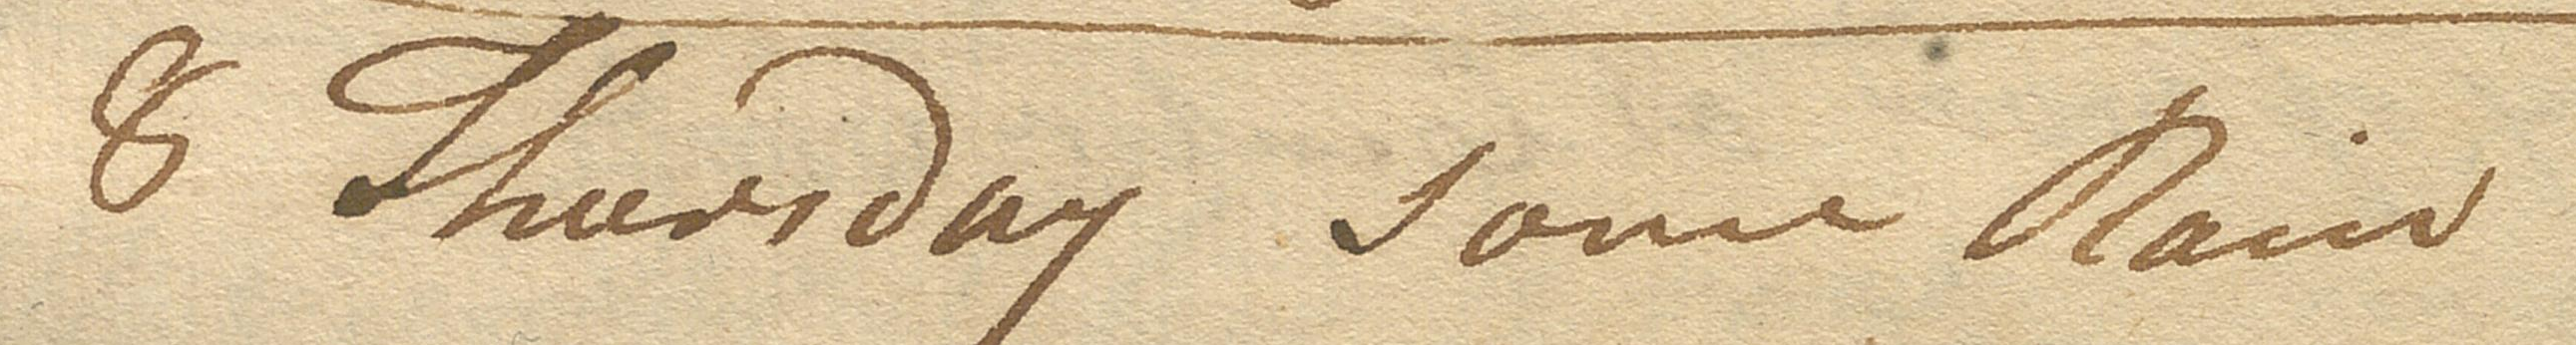8 Thursday some Rain
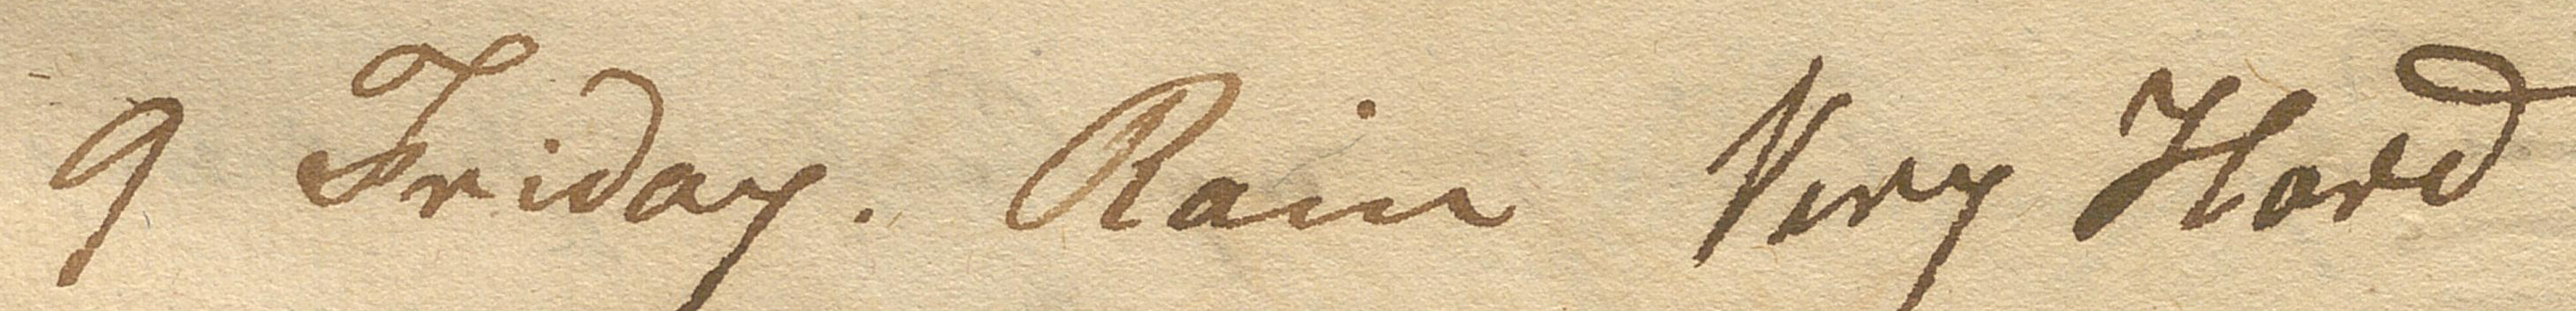9 Friday. Rain Very Hard
